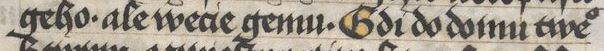geho.ale wecie gemu. Gdi do domu tweo
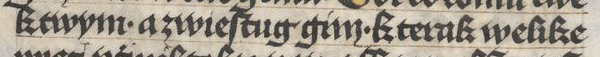k twým.a zwieſtug gim.kterak welike
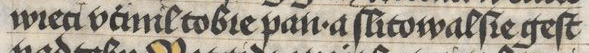wieci uċinil tobie pan.a ſlitowal ſie geſt
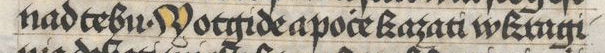nad tebu.Yotgide a poċe kazati wkragi
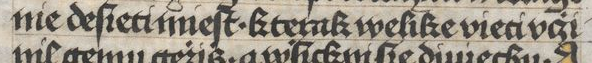nie deſieti mieſt.kterak welike vieci vcżi¬
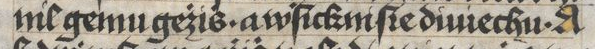nil gemu gežís.a wẛickni ſe diwiechu. A
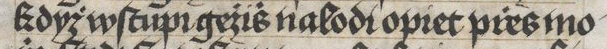když wſtupí geżíṡ nalodi opiet pṙes mo¬
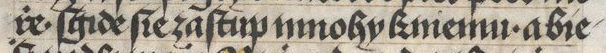ṙe.ſgide ſie zaſtup mnohy kniemu a bíe¬
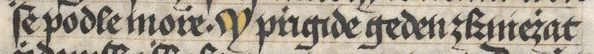ẛe podle moṙe.Y pṙigide geden z kniežat
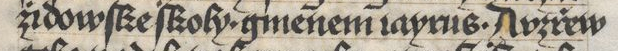żidowſké ẛkoly.gmenem iayrus.A uzřew¬
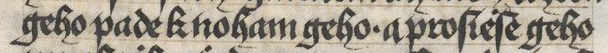geho pade k noham geho.a proſieẛe geho
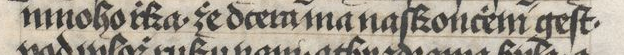nnoho ṙka.że dcera ma naſkonċení geſt.
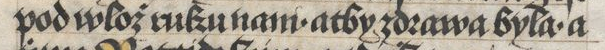pod wlož ruku nani.atby zdrawa byla.a
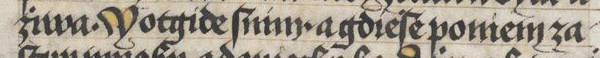żiwa.Y otgide ſnim.a gdíeẛe poniem za¬
